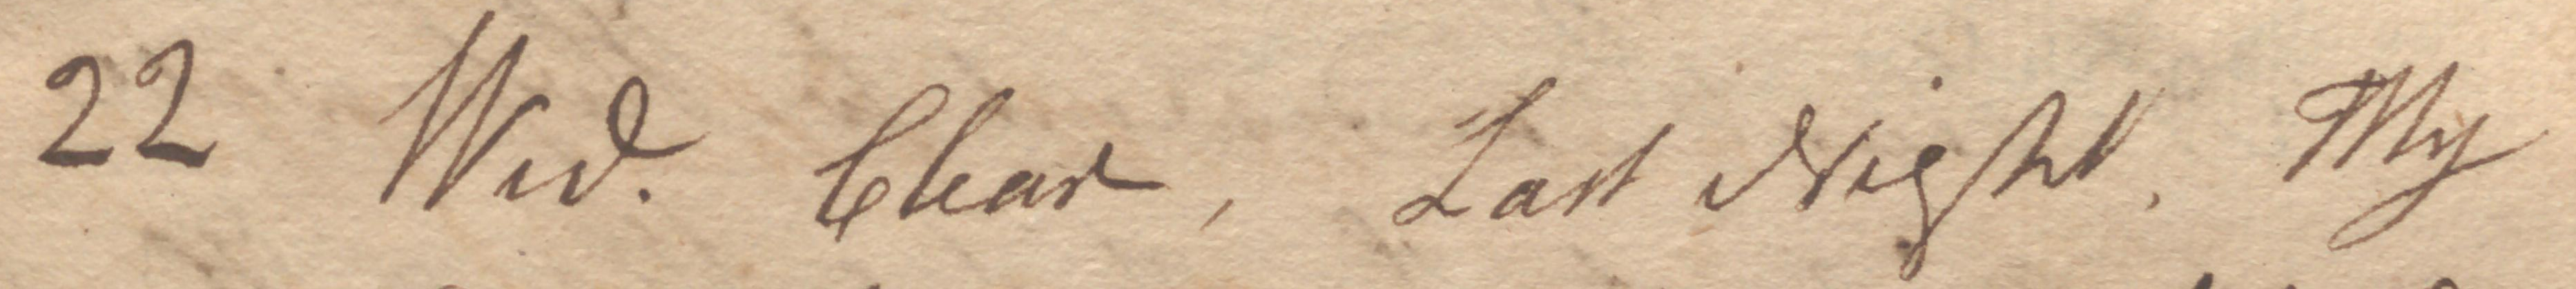22 Wed. Clear, Last Night My
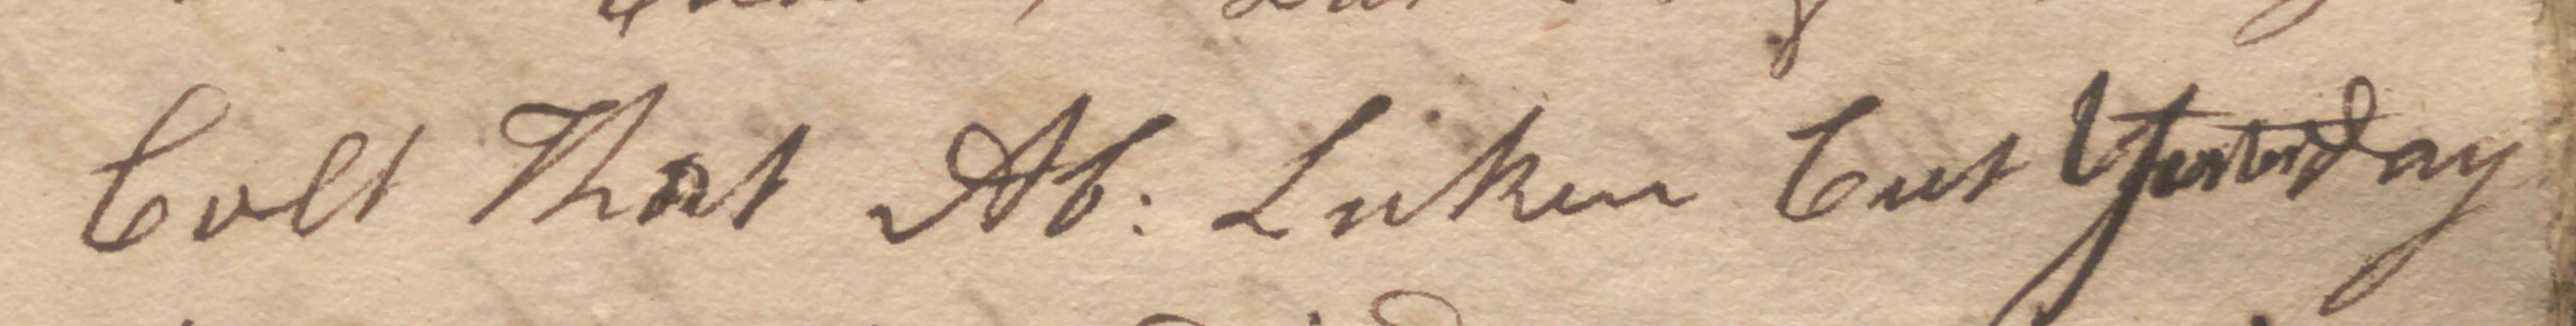Colt That Ab: Luken Cut yesterday
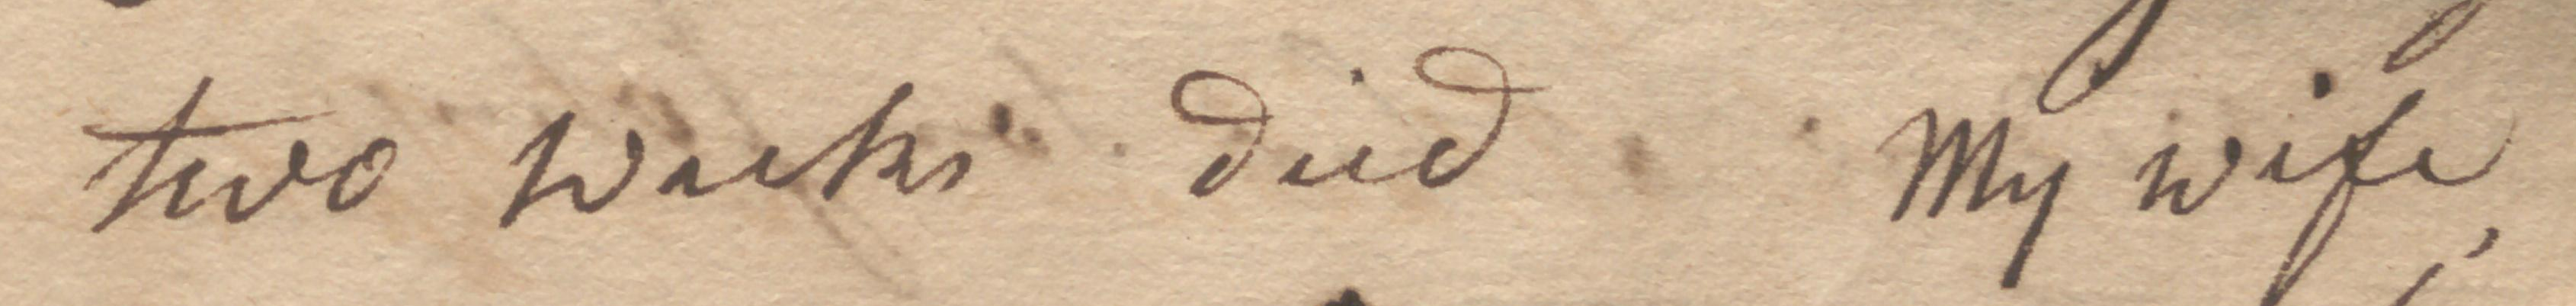two weeks died My wife
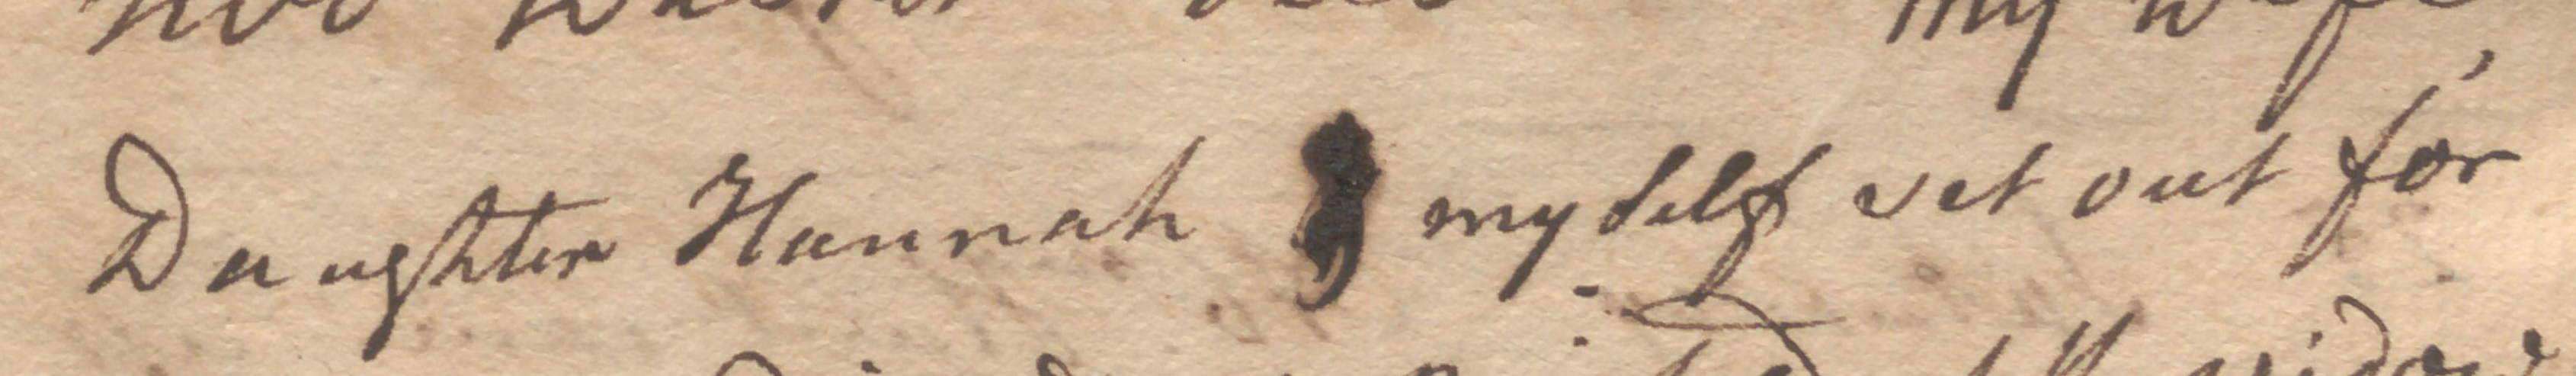Daughter Hannah & myself set out for
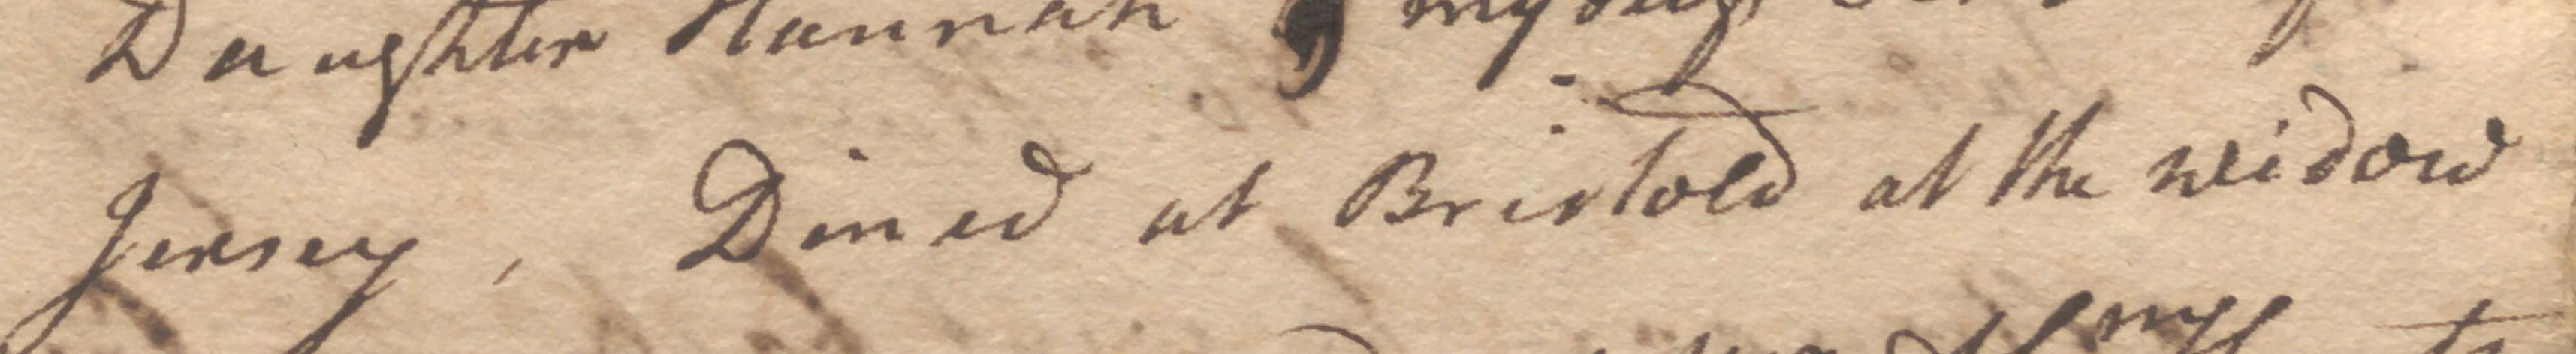Jersey, Dined at Bristold at the widow
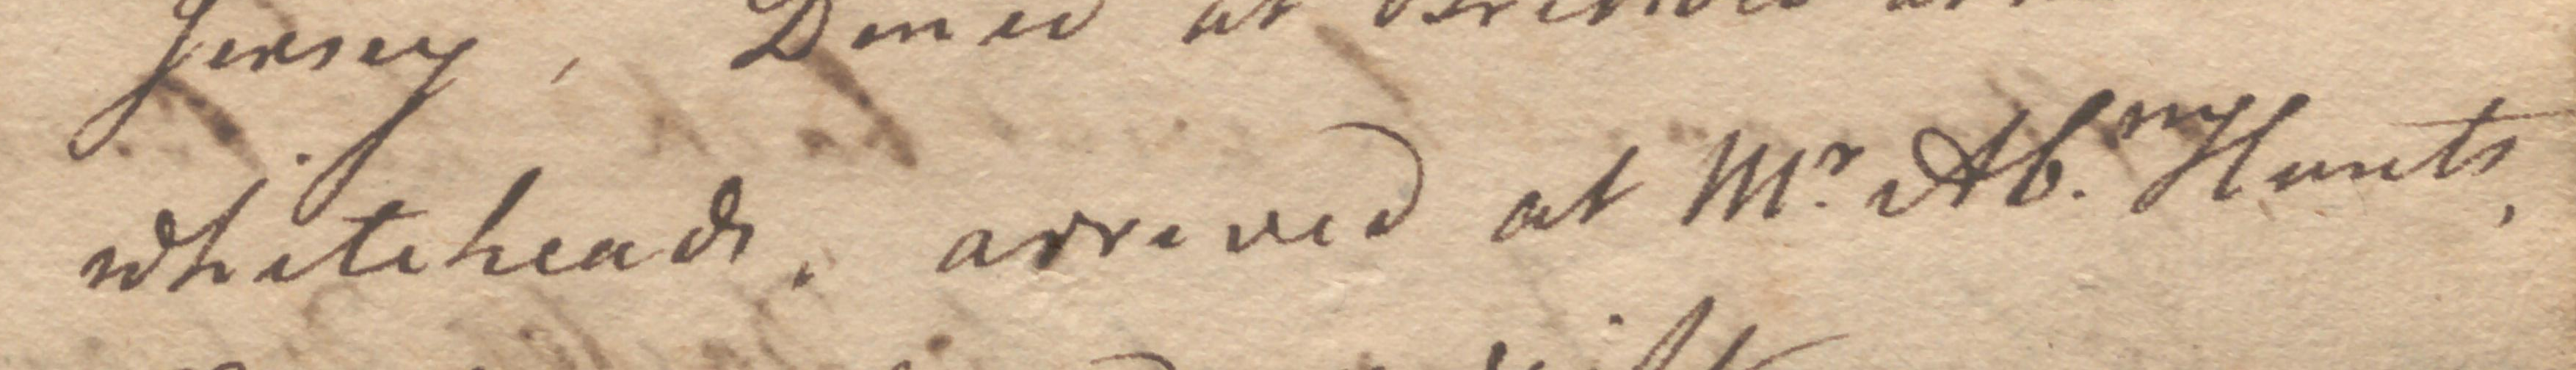whiteheads, arrived at M^r. Ab^m. Hunts
